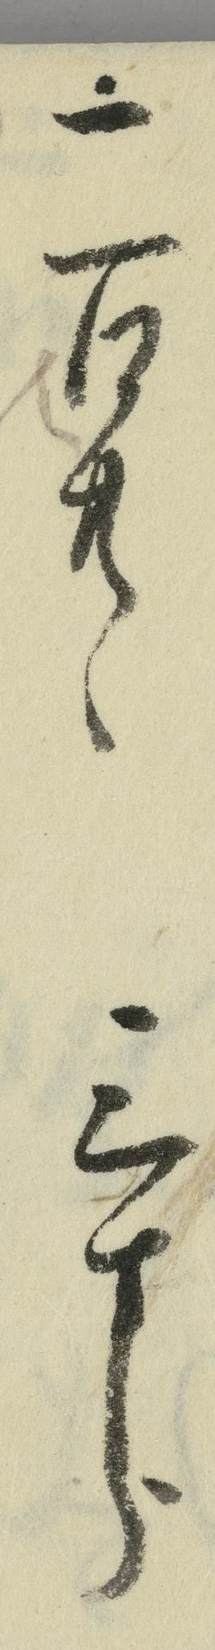一百廿文三十郎
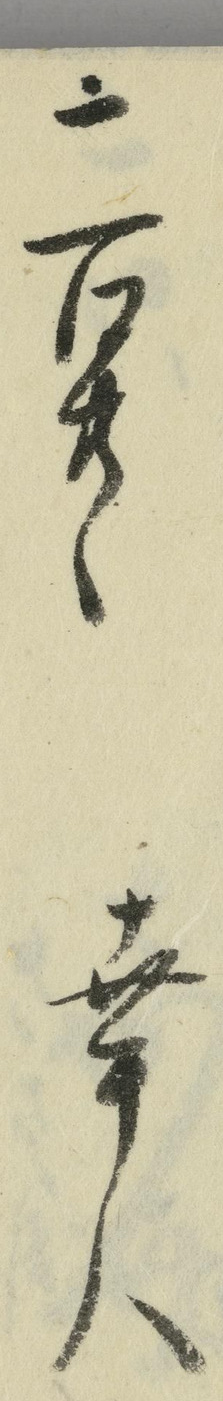一百廿文三十郎
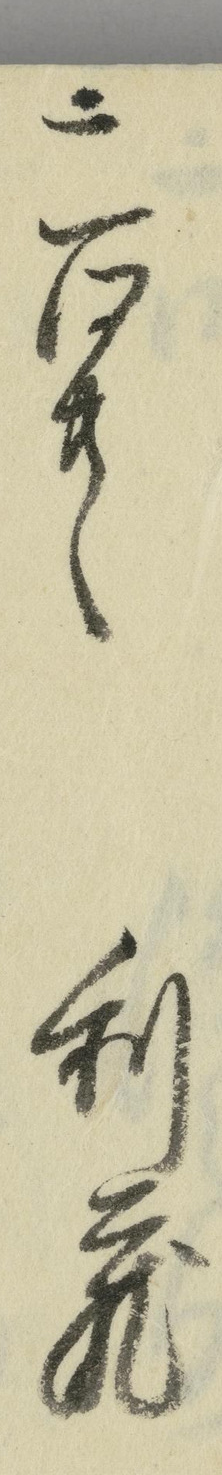一百廿文利蔵
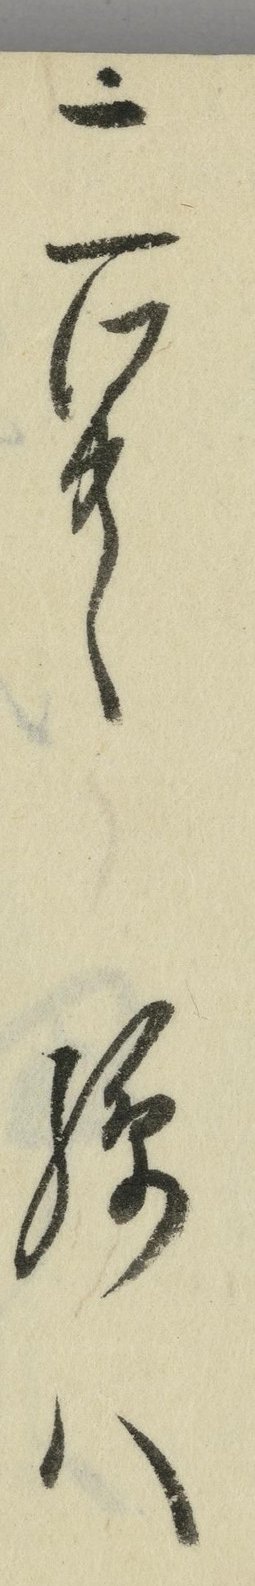一百廿文孫八
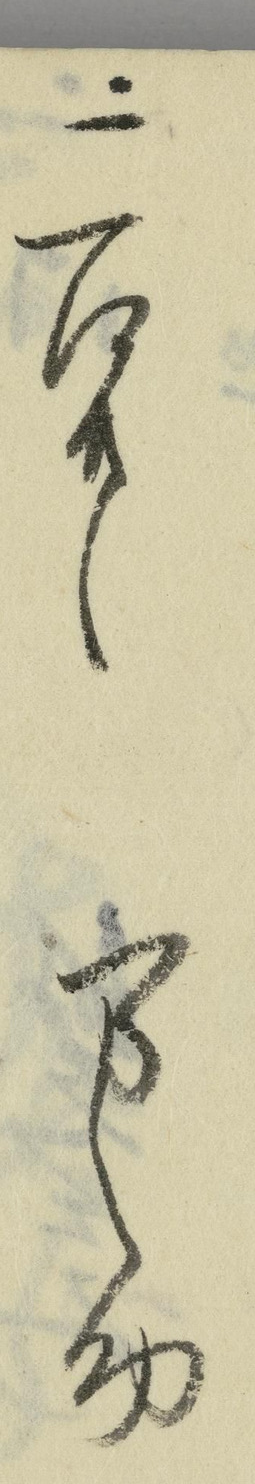一百廿文万之助
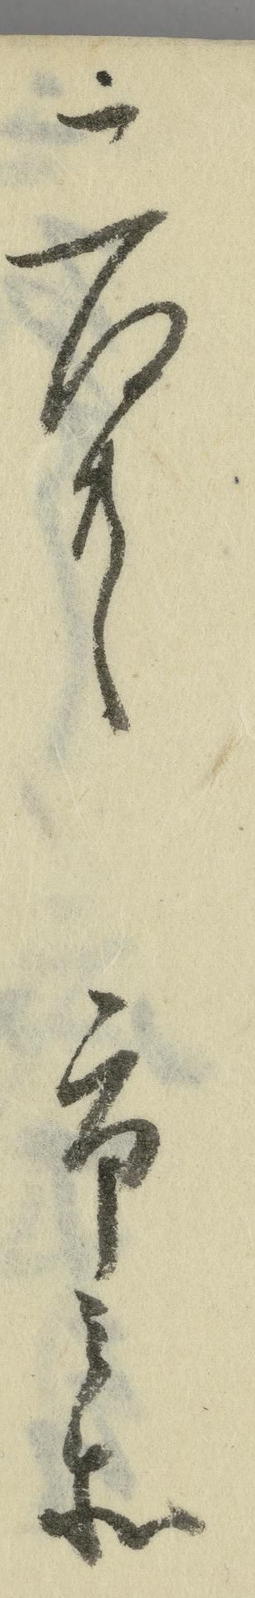一百廿文市兵衛
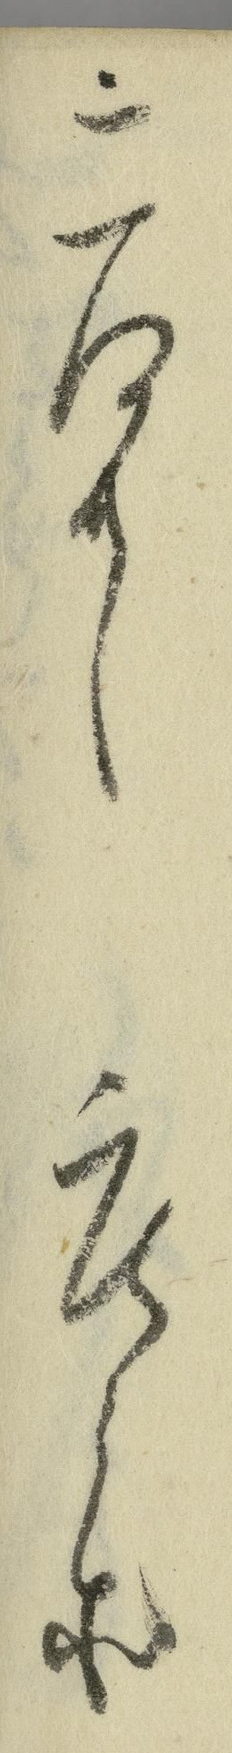一百廿文庄兵衛
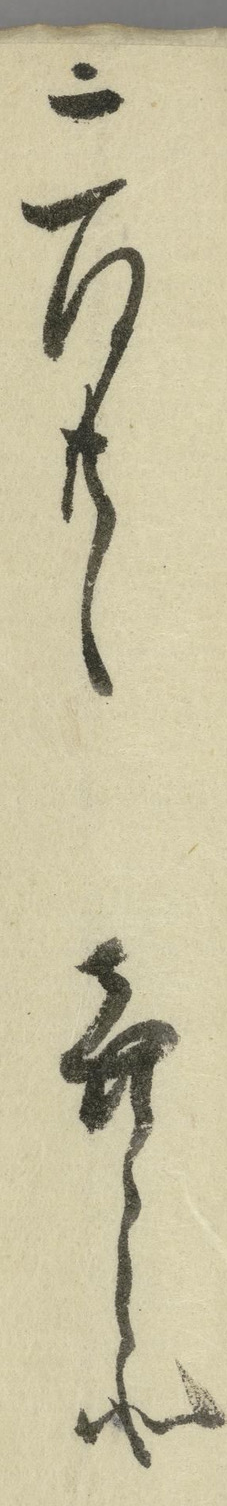一百廿文市兵衛
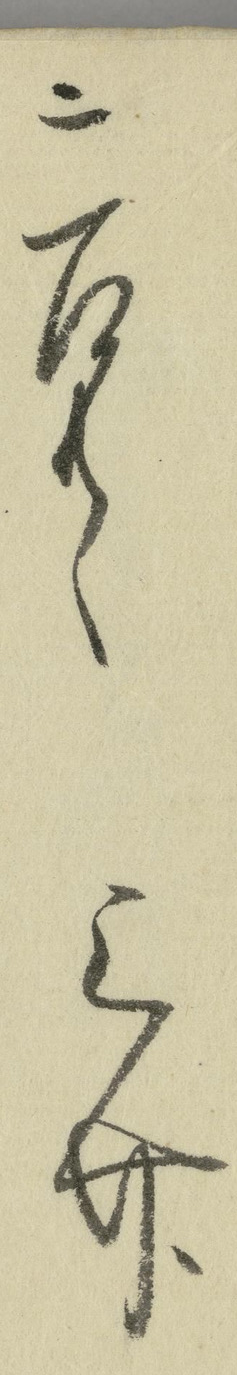一百廿文三十郎
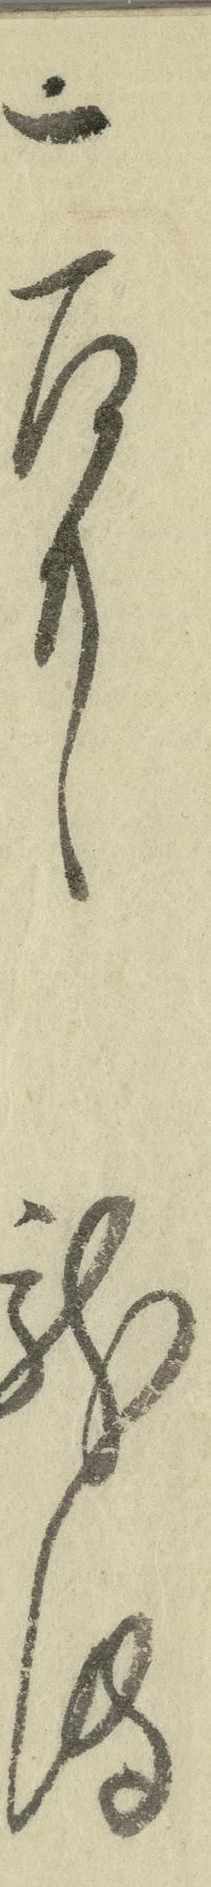一百廿文長元

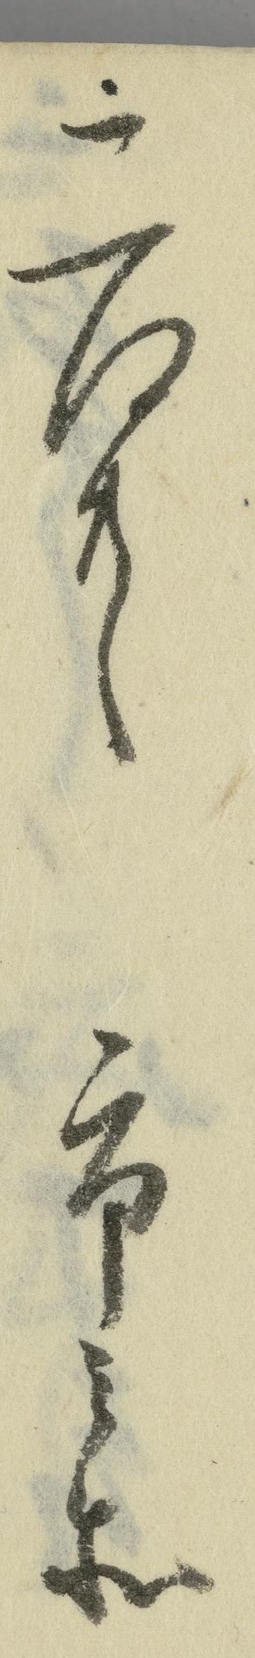一百廿文喜兵衛
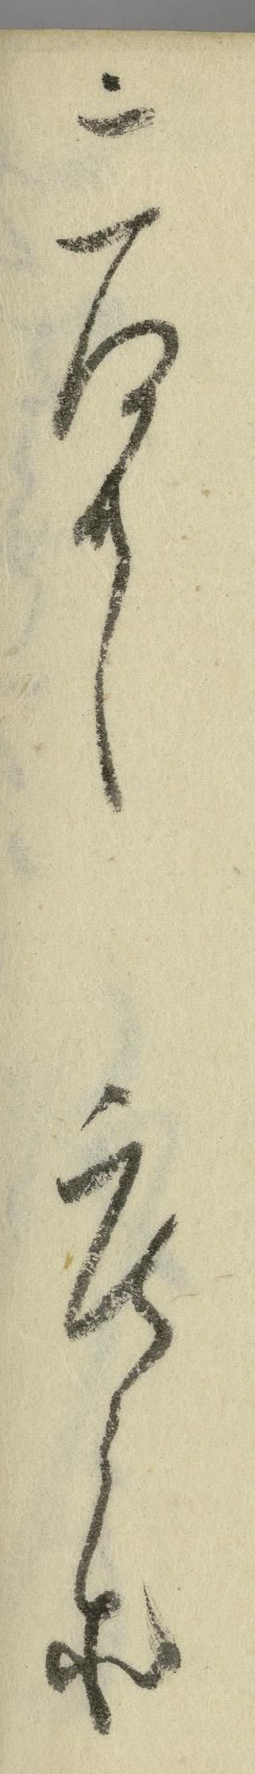一百廿文喜兵衛
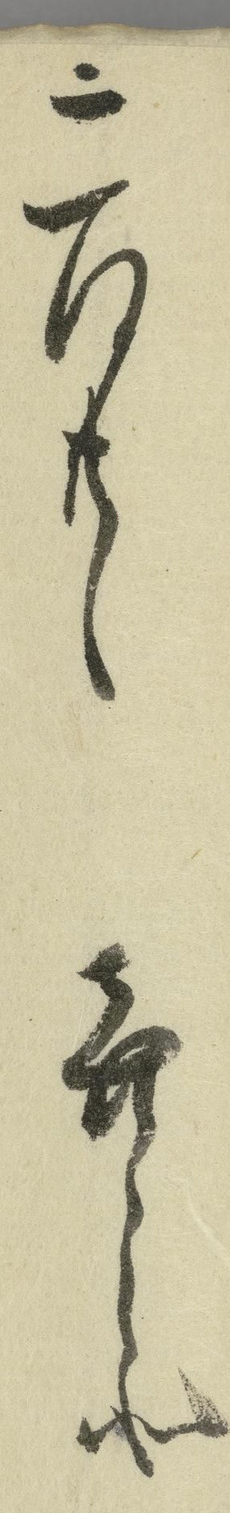一百廿文喜兵衛
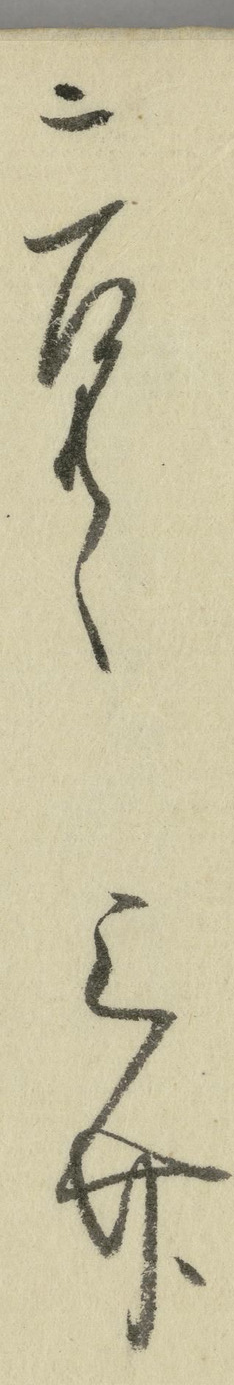一百廿文三介
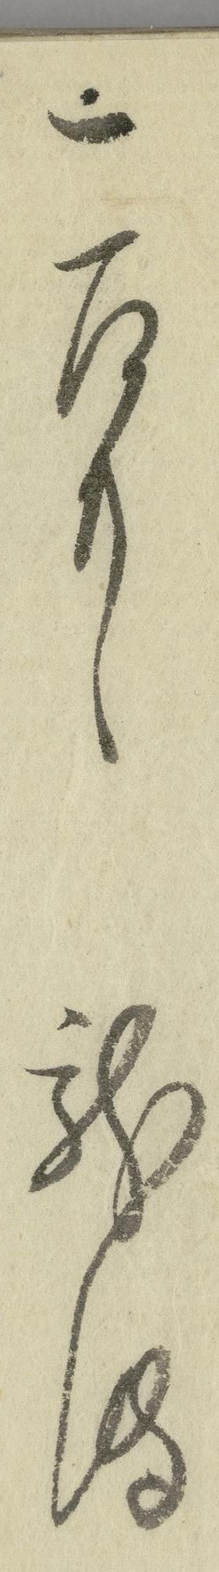一百廿文新伝
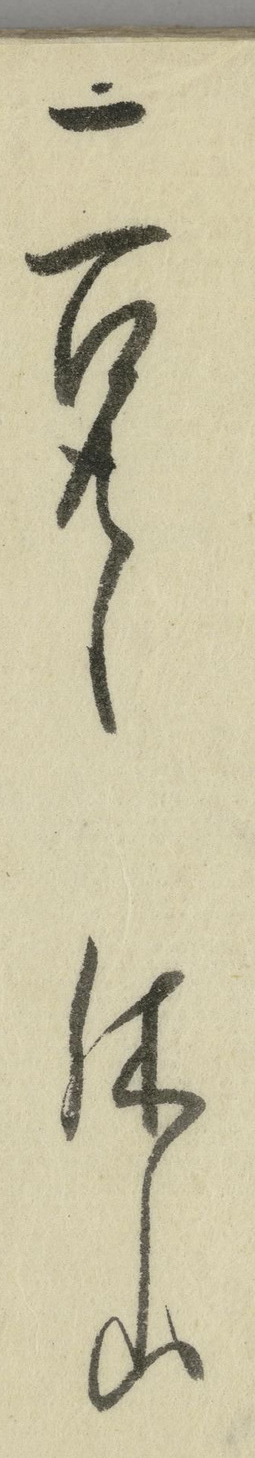一百廿文休山
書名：天明淺間噴火ニ関スル書類
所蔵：東京大学地震研究所図書室 Earthquake Research Institute Library, The University of Tokyo, JAPAN
